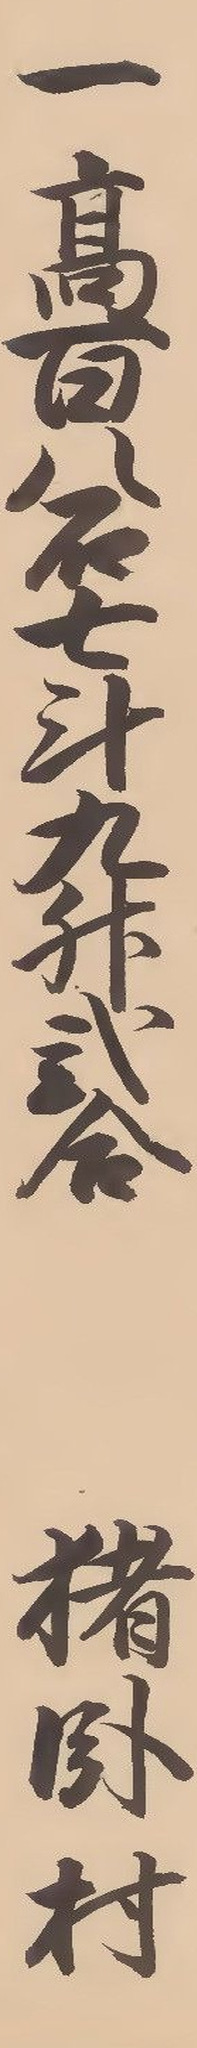一高百八石七斗九升弐合猪臥村
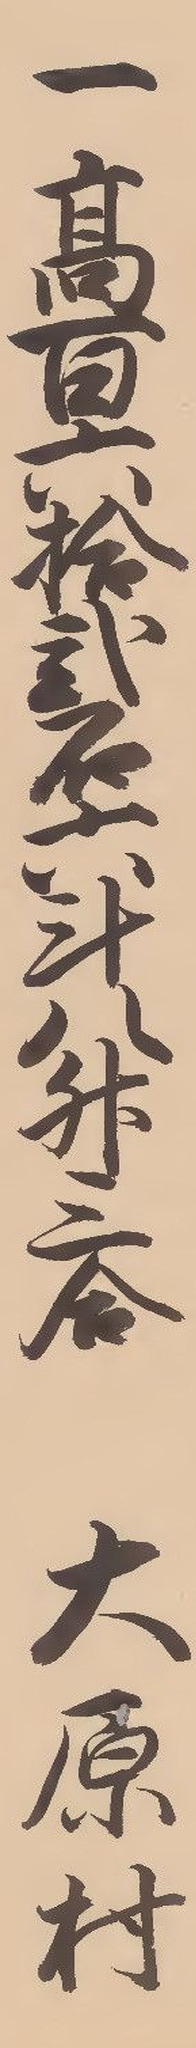一高百六拾弐石六斗八升三合大原村
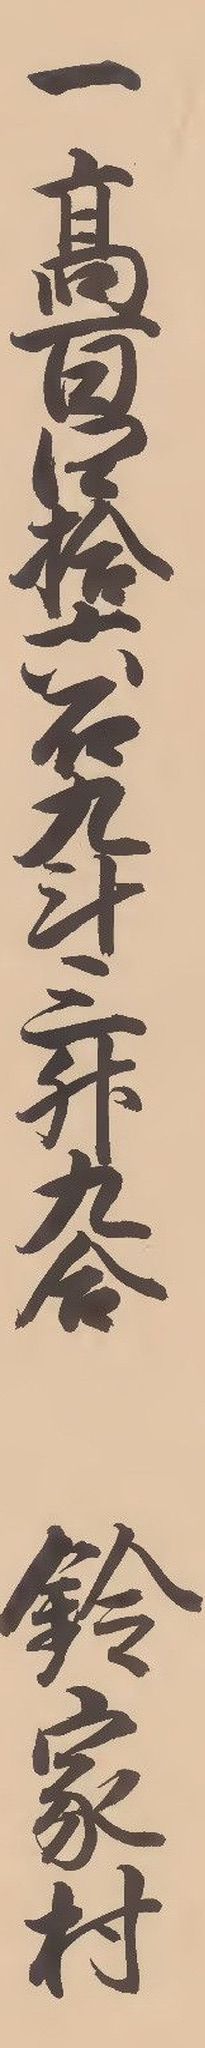一高百四拾六石九斗三升九合鈴家村
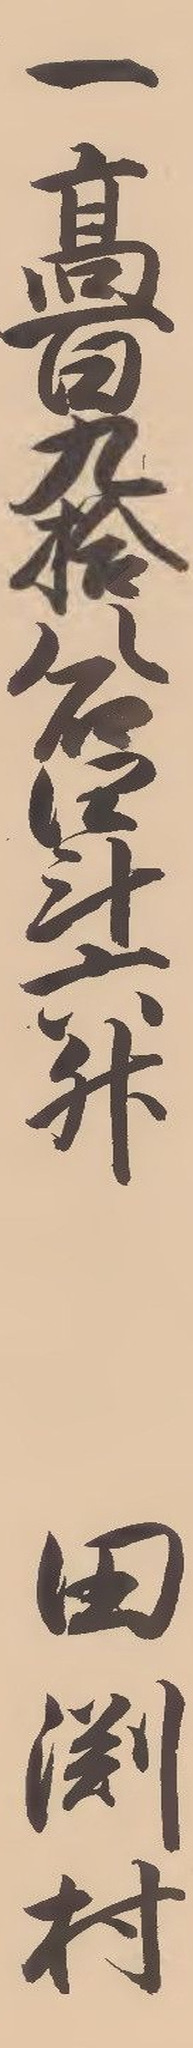一高百九拾八石四斗六升田淵村
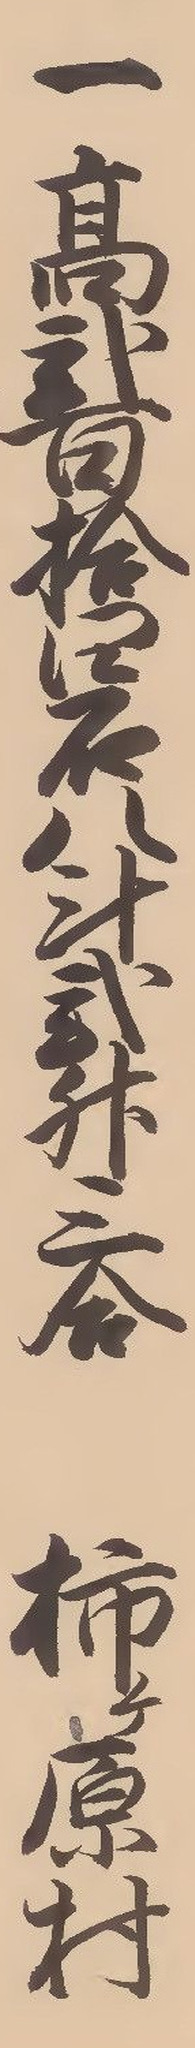一高弐百拾四石八斗弐升三合柿ヶ原村
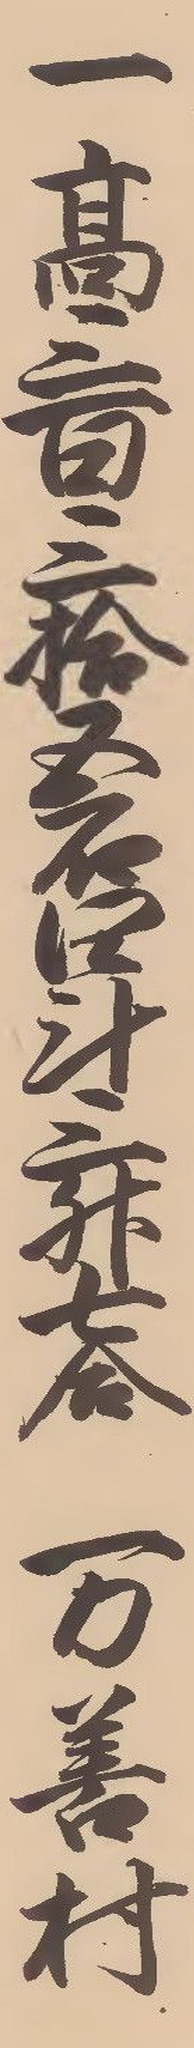一高三百三拾五石四斗三升七合万善村
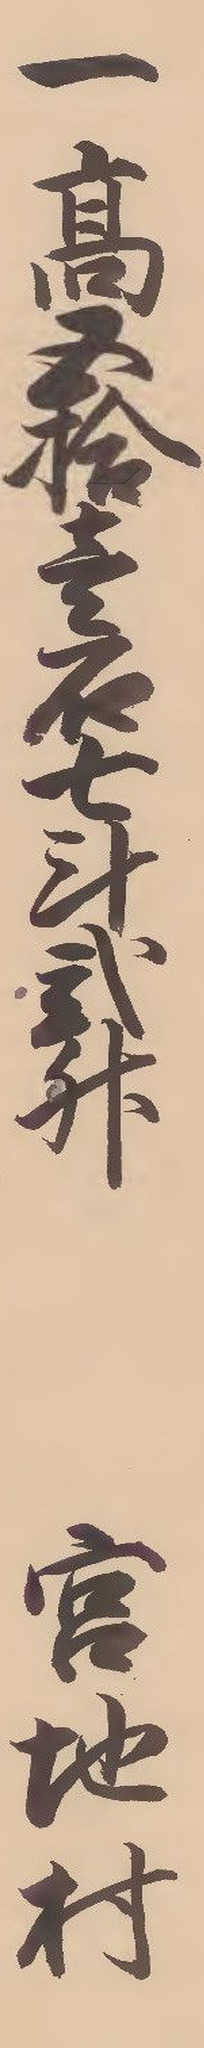一高五拾壱石七斗弐升宮地村

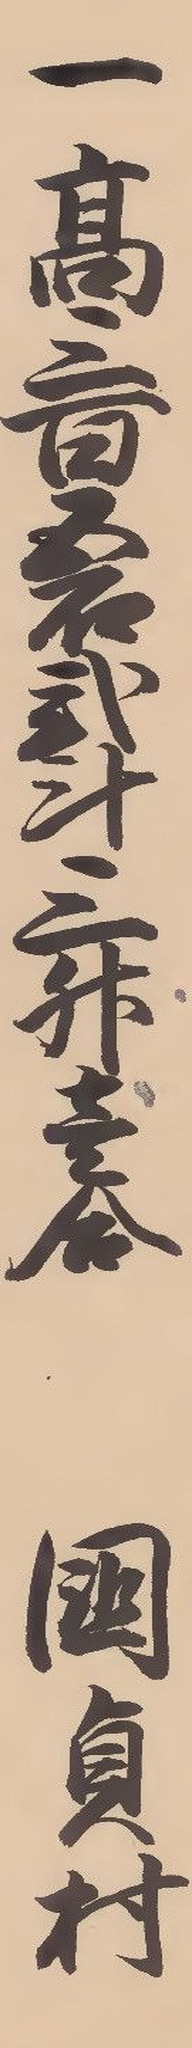一高三百五石弐斗三升壱合国貞村
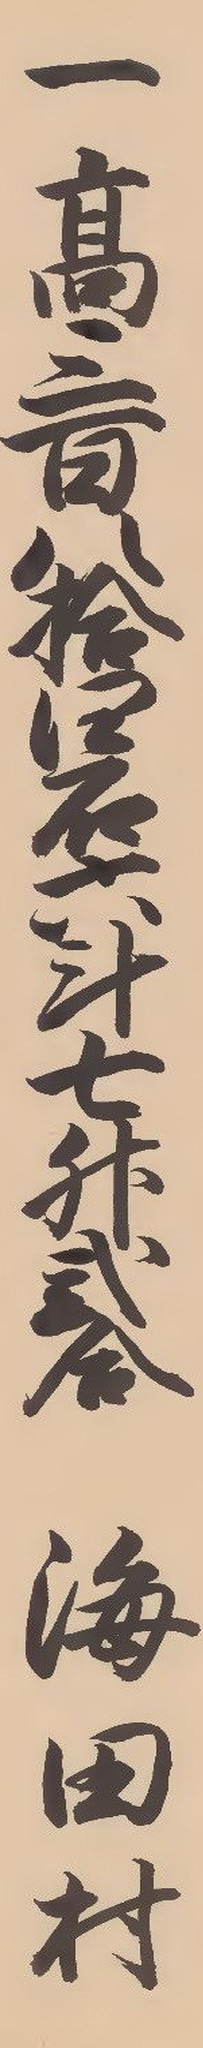一高三百八拾四石六斗七升弐合海田村
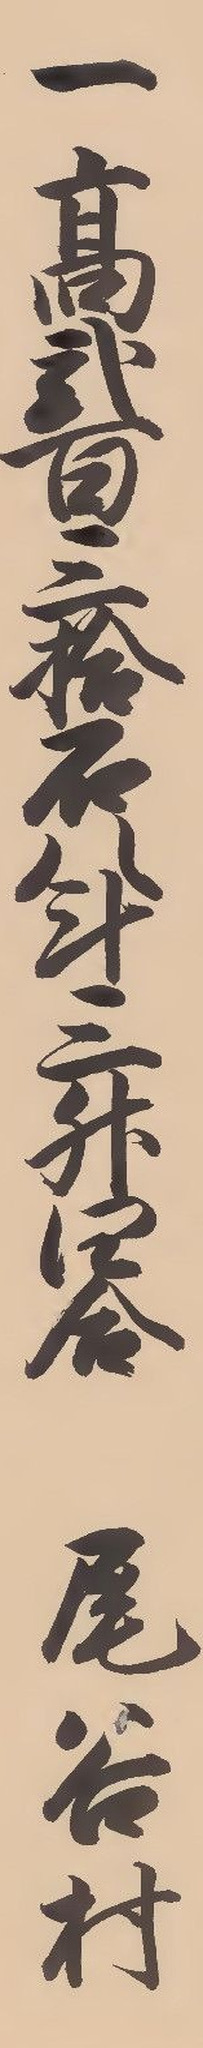一高弐百三拾石八斗三升四合尾谷村
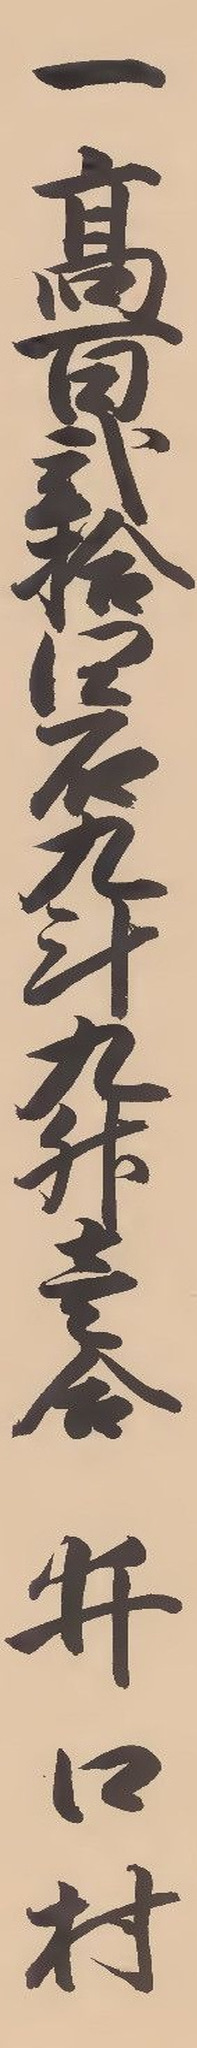一高百弐拾四石九斗九升壱合井口村
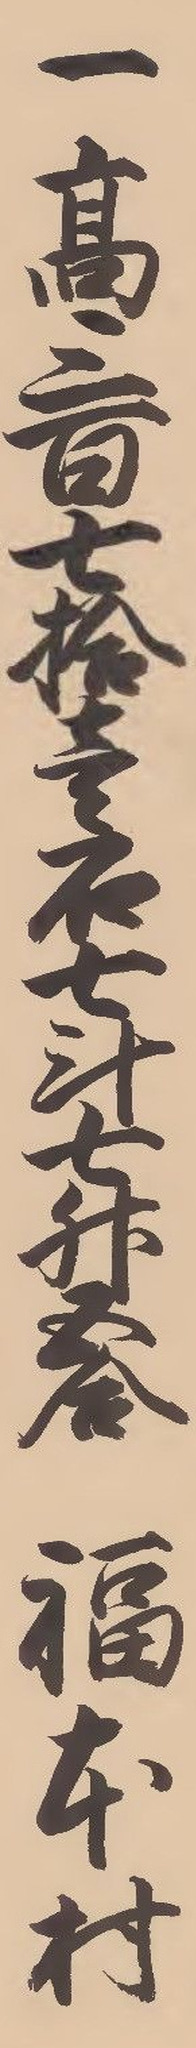一高三百七拾壱石七斗七升五合福本村
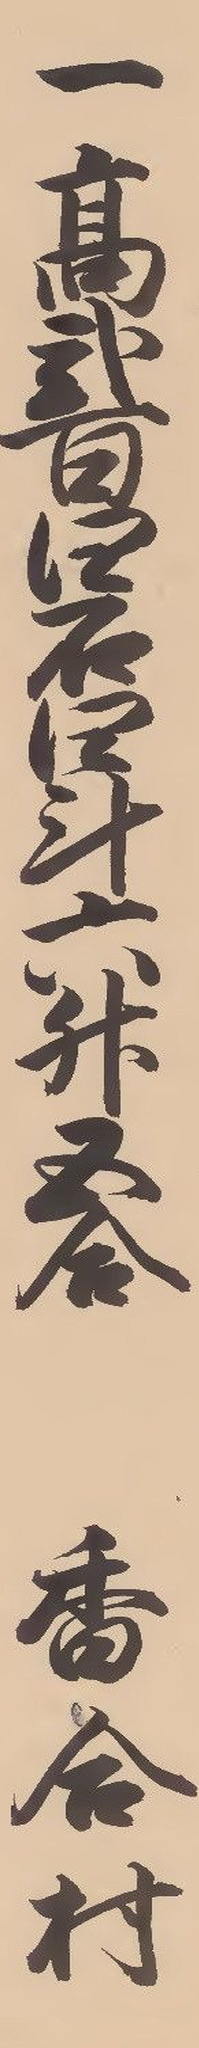一高弐百四石四斗六升五合香合村
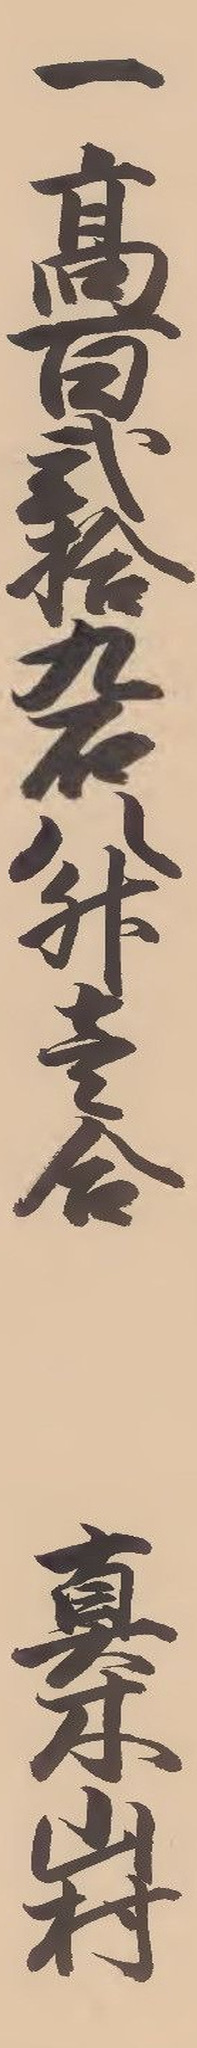一高百弐拾九石八升壱合真木山村
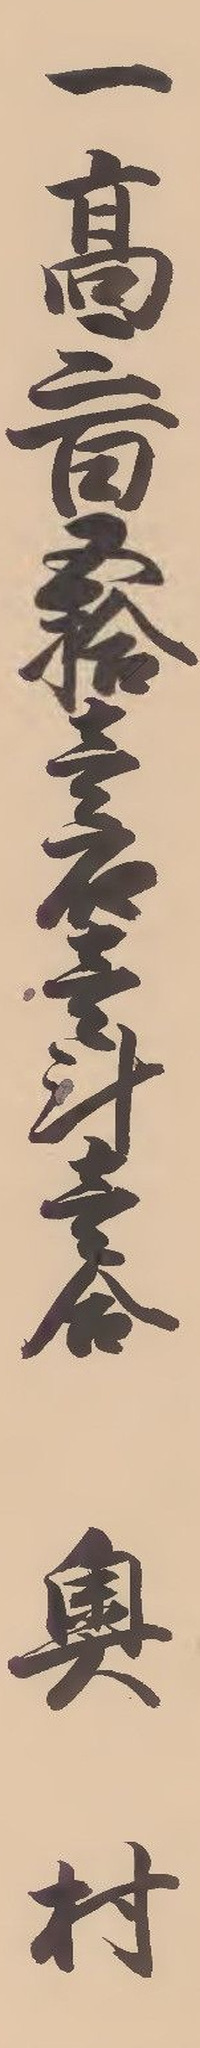一高三百五拾壱石壱斗壱合奥村

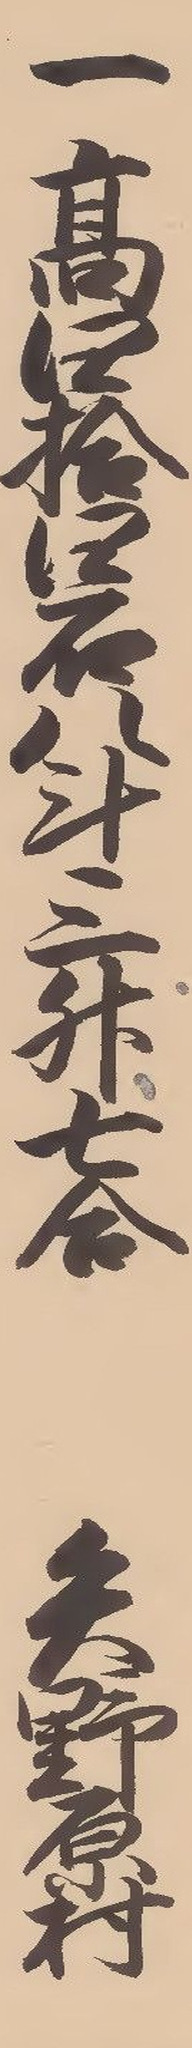一高四拾四石八斗三升七合矢野原村
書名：美作国郷帳
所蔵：国立公文書館 National Archives of Japan
